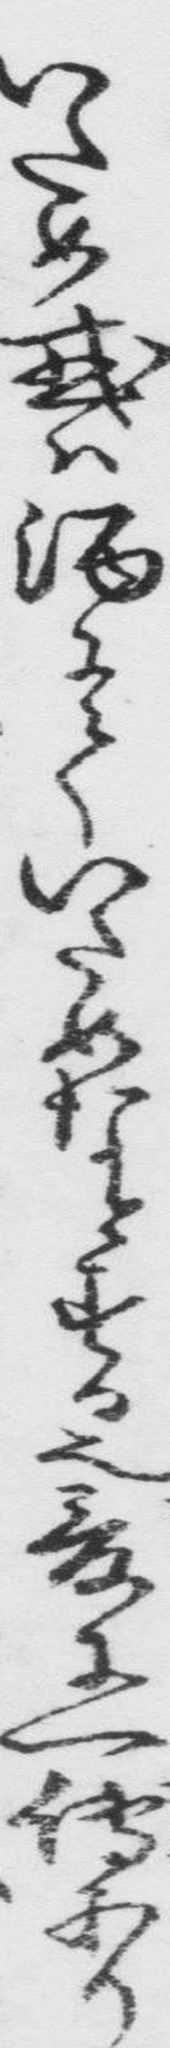いため或は酒にていためなとする也爰に一伝あり
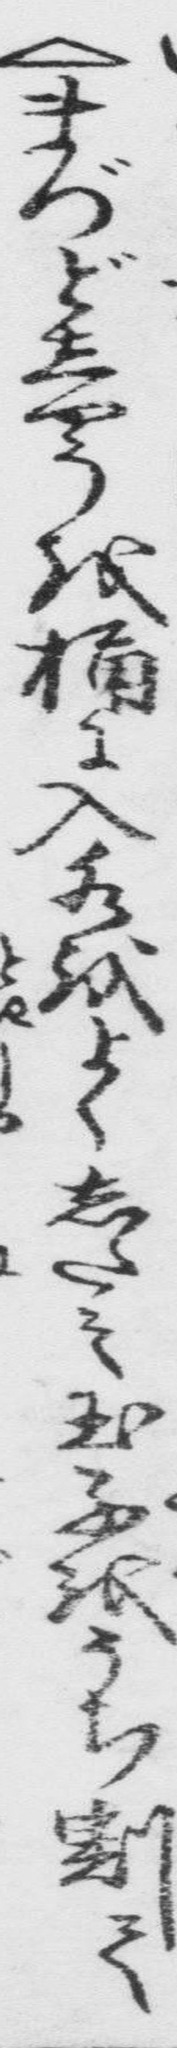△まづどしやうを桶に入水をよくしたみ玉子をうち割て
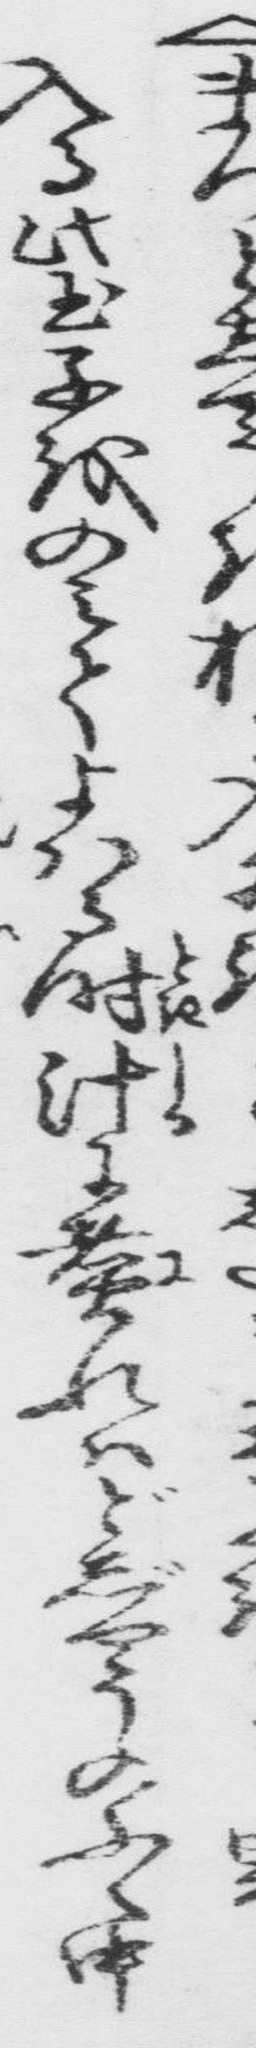入る此玉子のみてよはる時汁に煮れはどじやうのく中
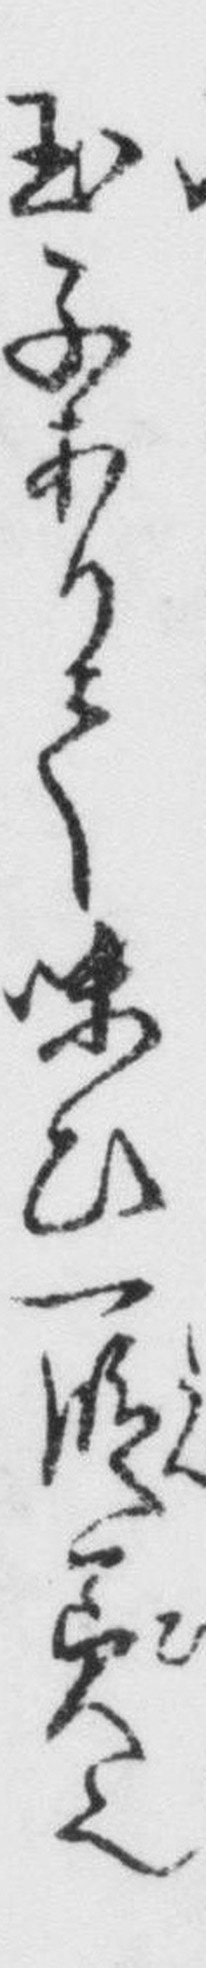玉子ありて味ひ一段美成
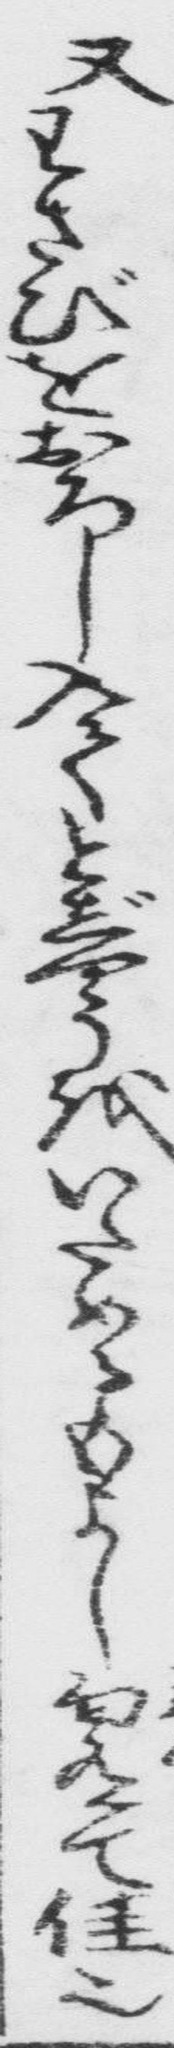又わさびをおろし入れてとじやうをいためるもよし匂有て佳也
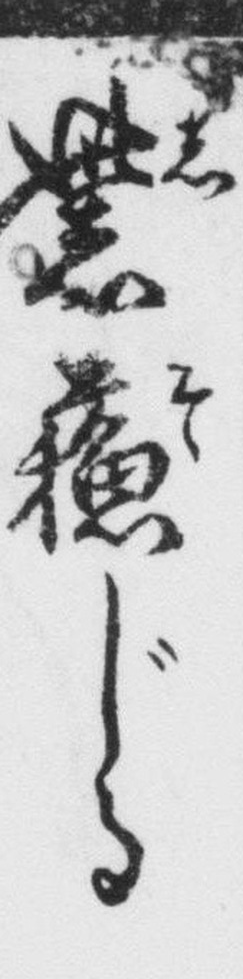紫蘇じる
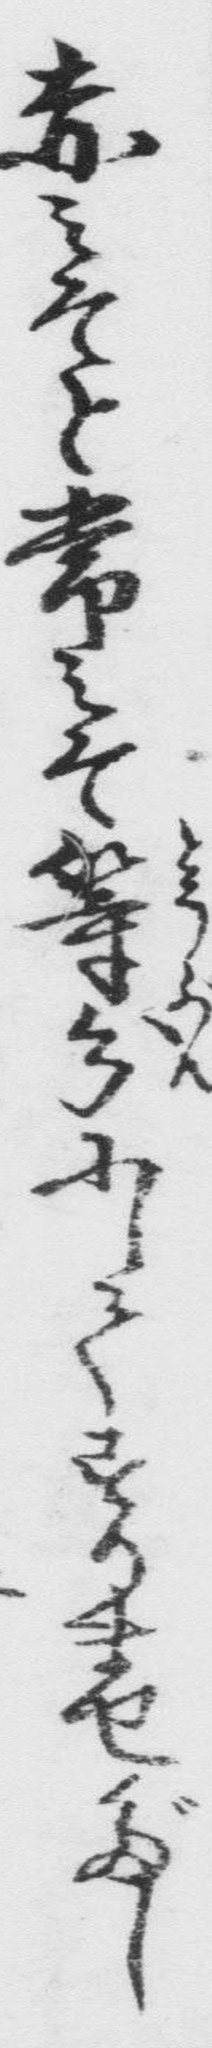赤みそと常みそ等分にしてすりませだし
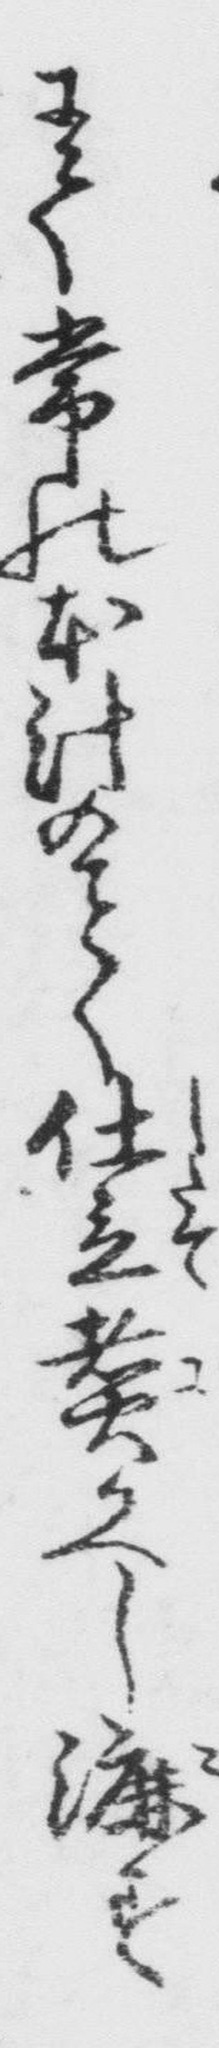にて常の本汁のごとく仕立煮かへし漉す
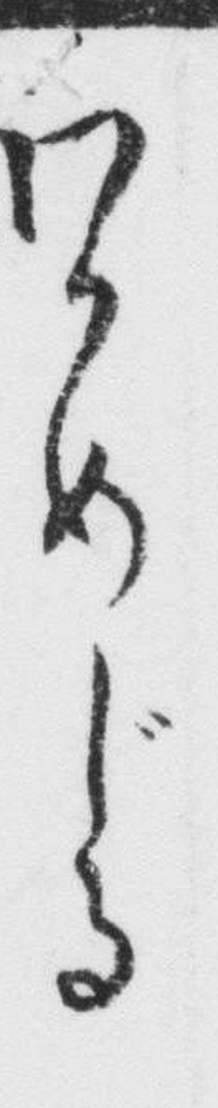わかめじる
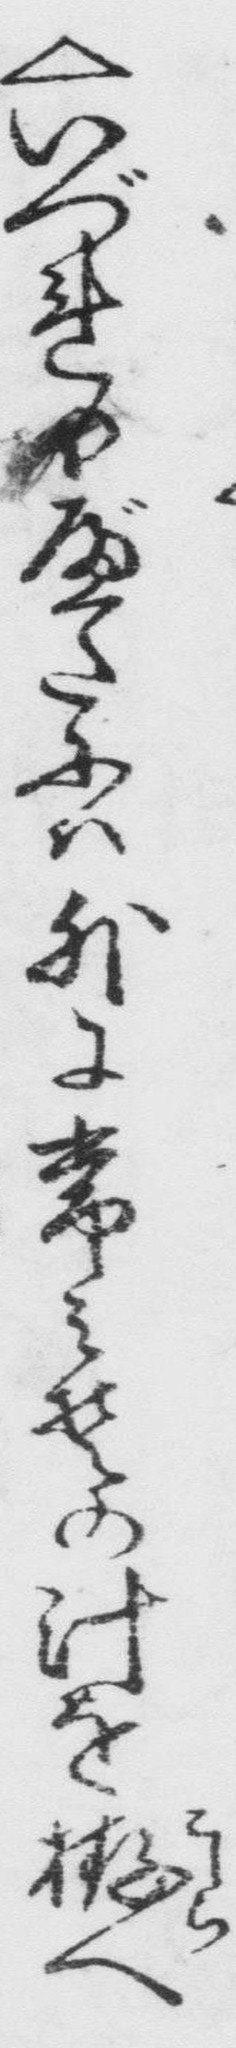△いづれもべたには水に常みその汁を拵へ
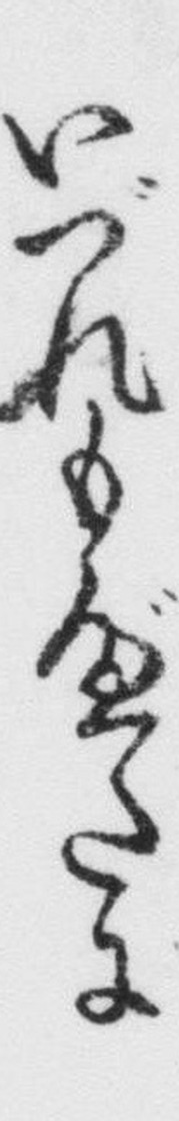いづれもべたに
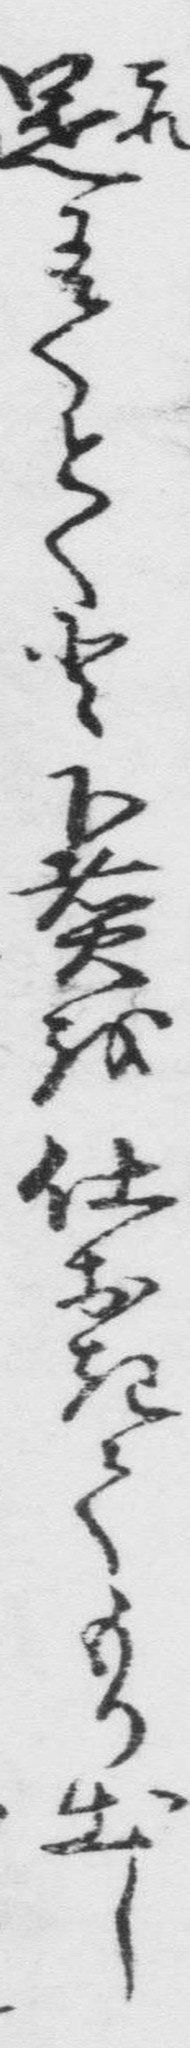是にてとくと下煮を仕おきてもり出し
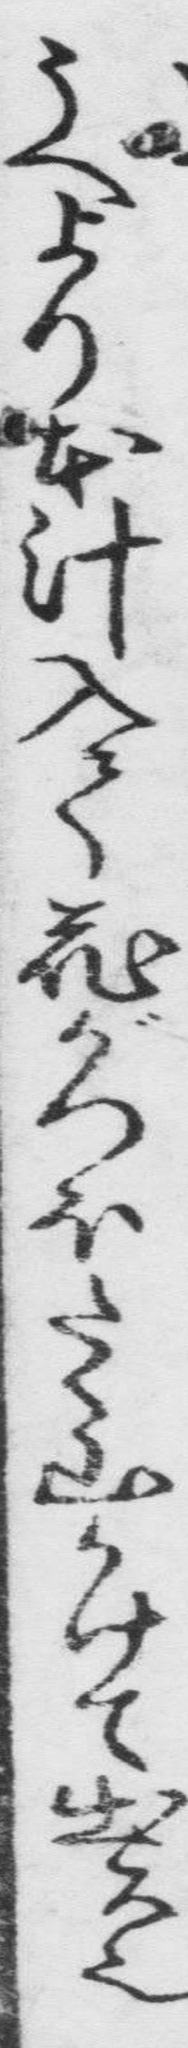うへより本汁入れて花がつほたく山かけて出す
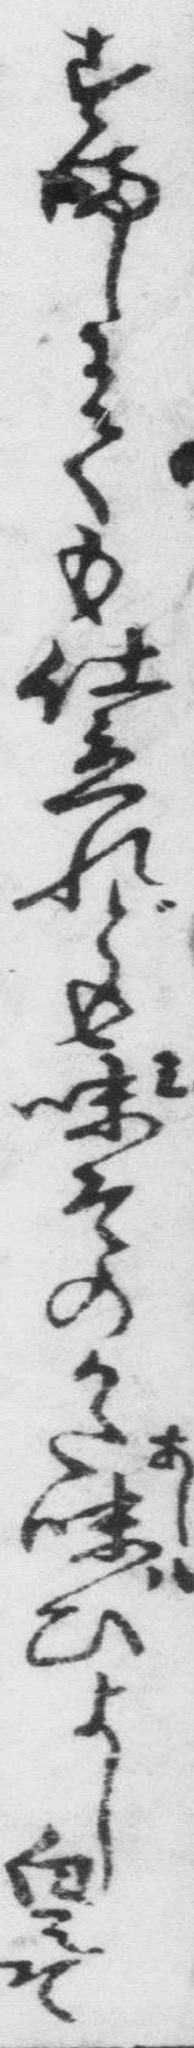すましにても仕立てれども味そのかた味ひよく白みそ
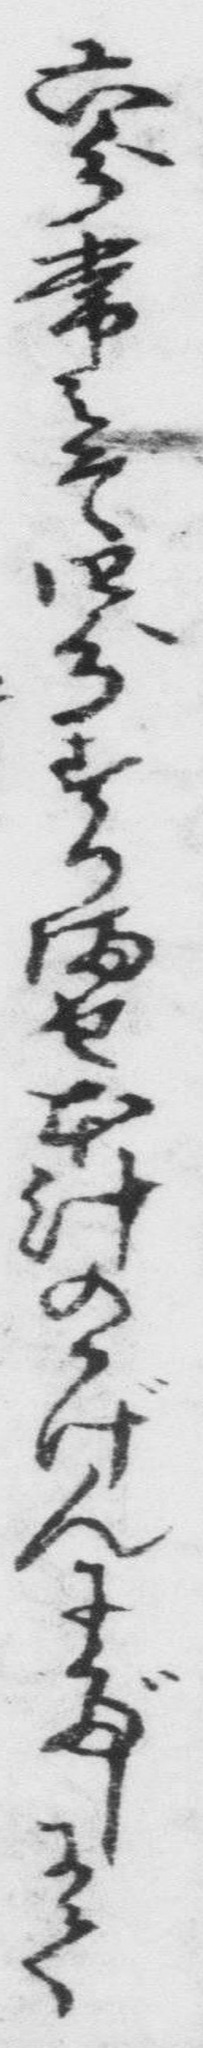六分常みそ四分すりませ本汁のかげんにだしにて
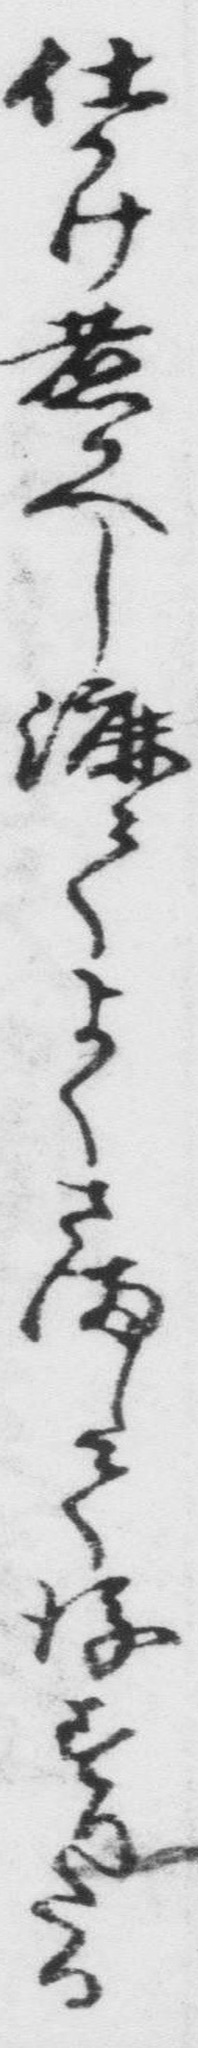仕かけ煮かへし漉てよくさまして後すりたる
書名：料理早指南
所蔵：大阪府立大学学術情報センター 国文学研究資料館
